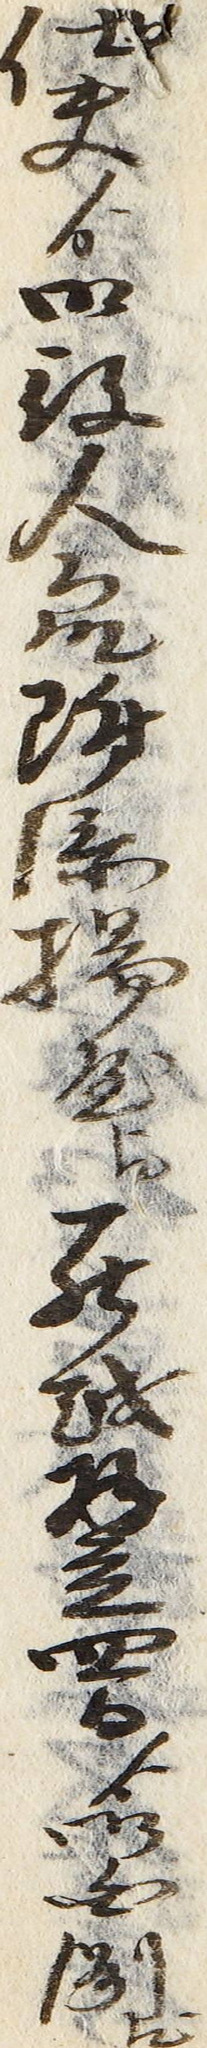仕夫ゟ御役人衆附添揚屋江罷越翌四日ゟ御白洲江
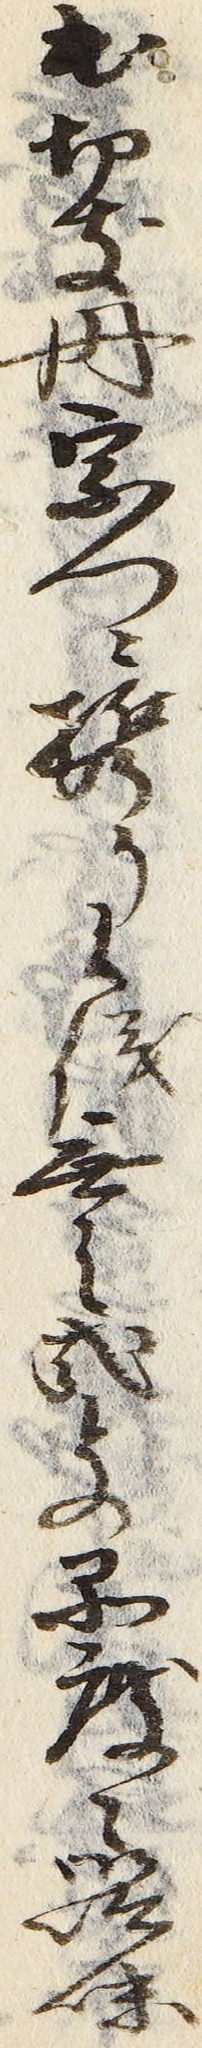出切支丹宗門ニ携り候儀無之哉との品度々御吟味
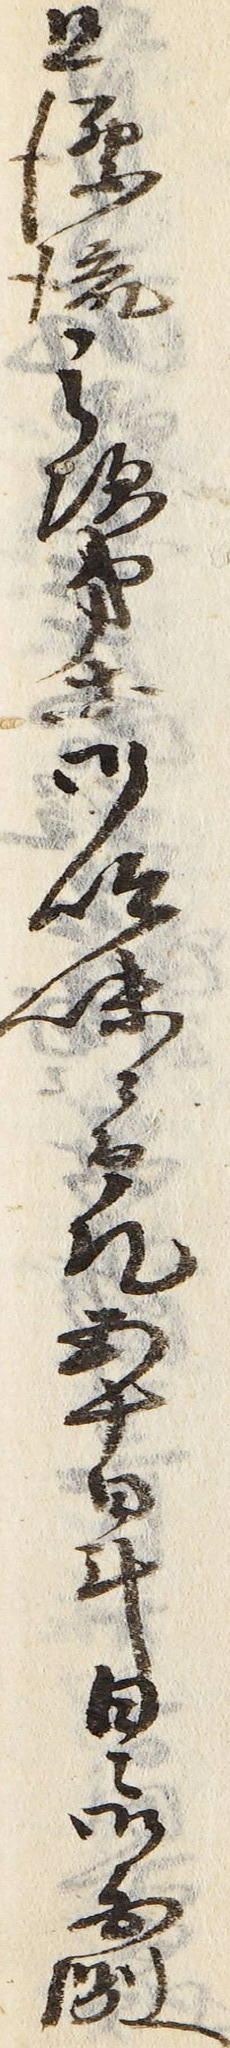且漂流之次第等御吟味ニ而凡五十日斗日々御白洲へ
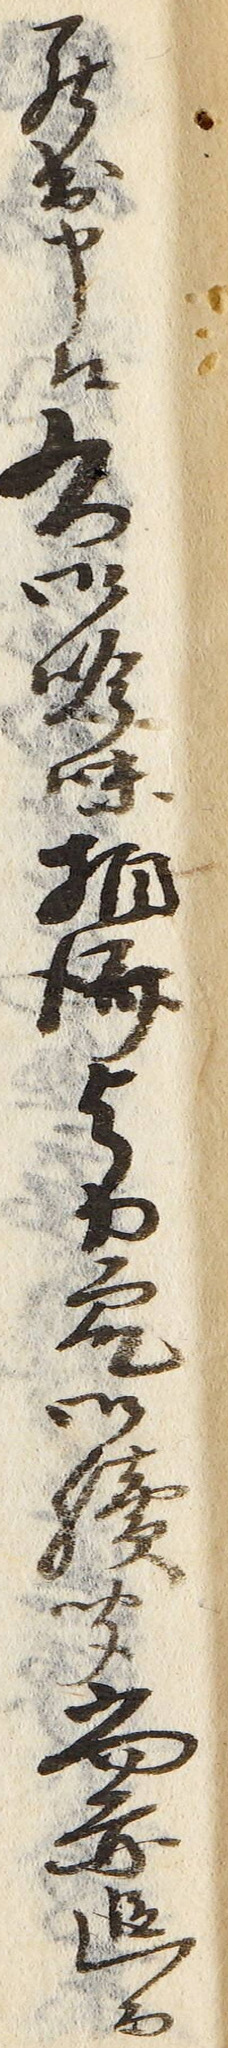罷出申候右御吟味相濟与力衆御讀聞尚亦追而
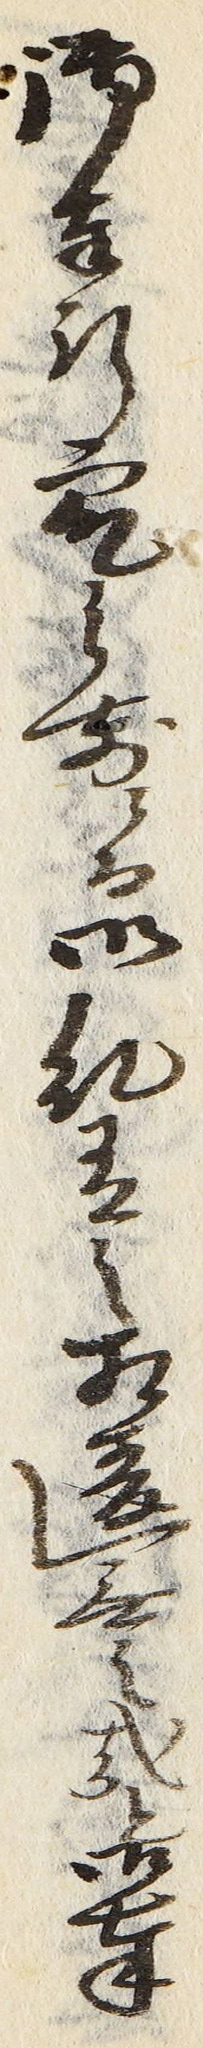御奉行衆之前ニ而御糺有之相違無之哉と御奉
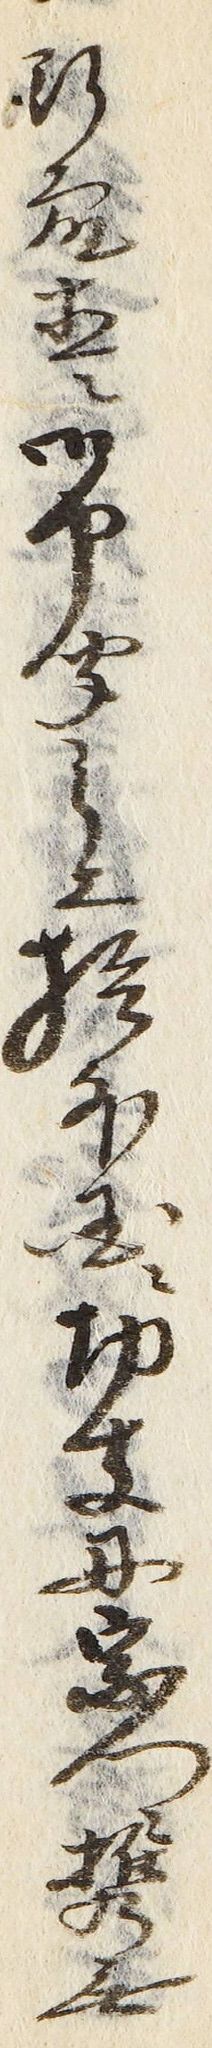行衆直ニ御申聞之上於外国ニ切支丹宗門携無
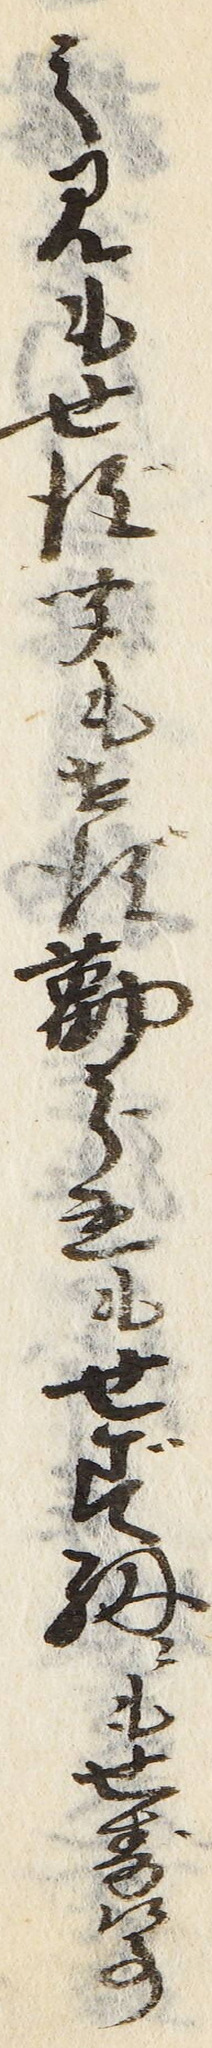之見もせず聞もせず勧られもせず詞ニもせす候事
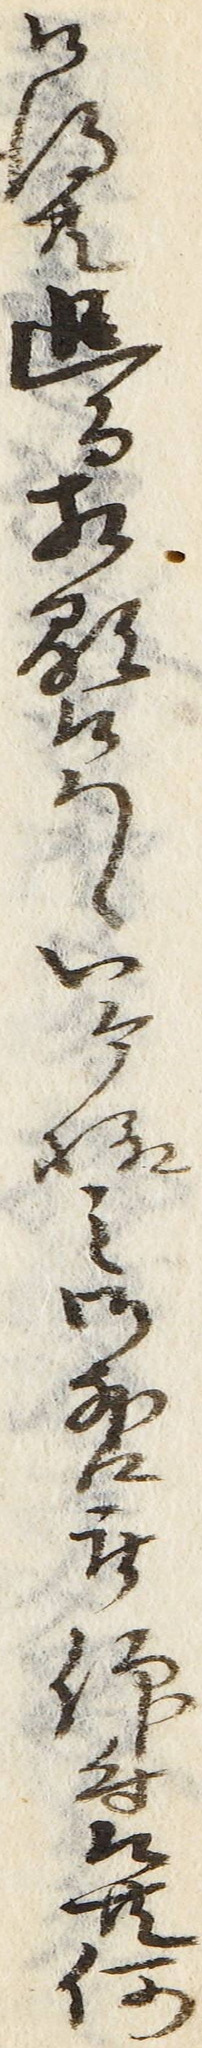候得共追而相顕候ハヽいケ様之御咎被仰付候共何
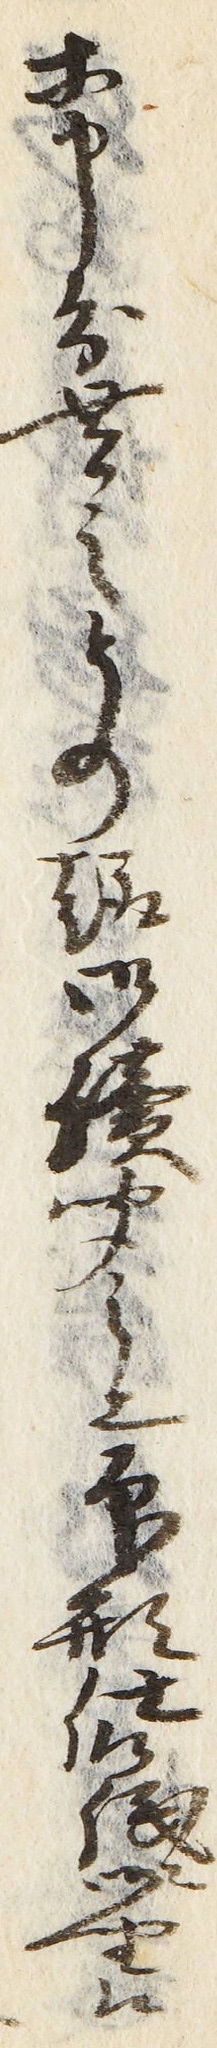等申分無之との趣御讀聞之上印形仕候儀ニ御座候
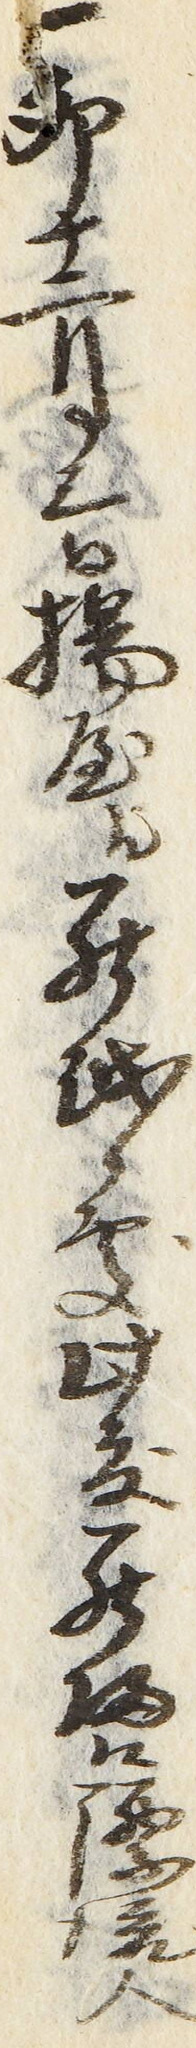一卯十二月三日揚屋江罷越候處この度罷帰候漂流人
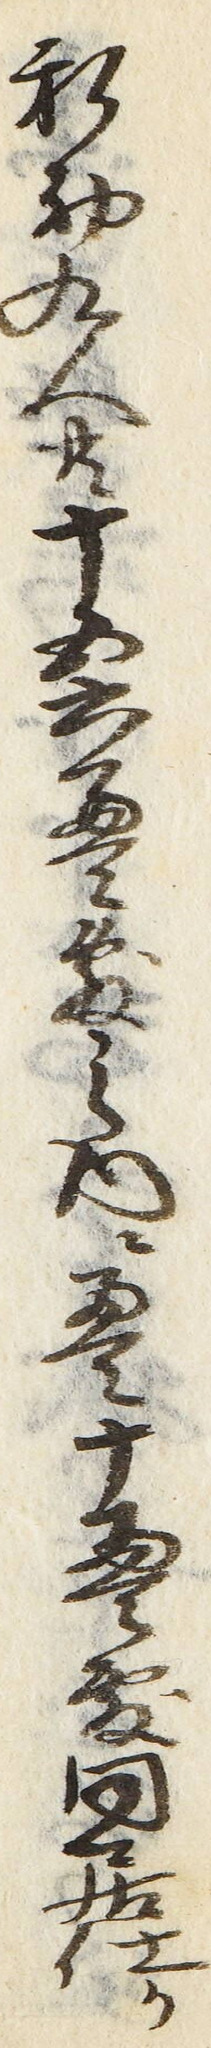私初九人共十五六畳敷之内ニ畳十畳敷同居仕り
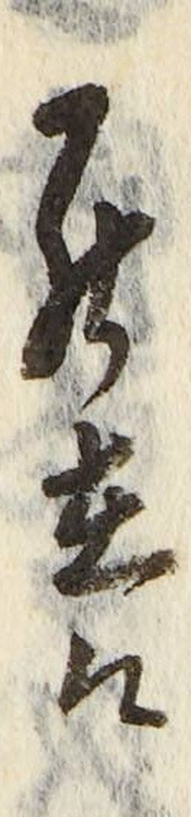罷在候

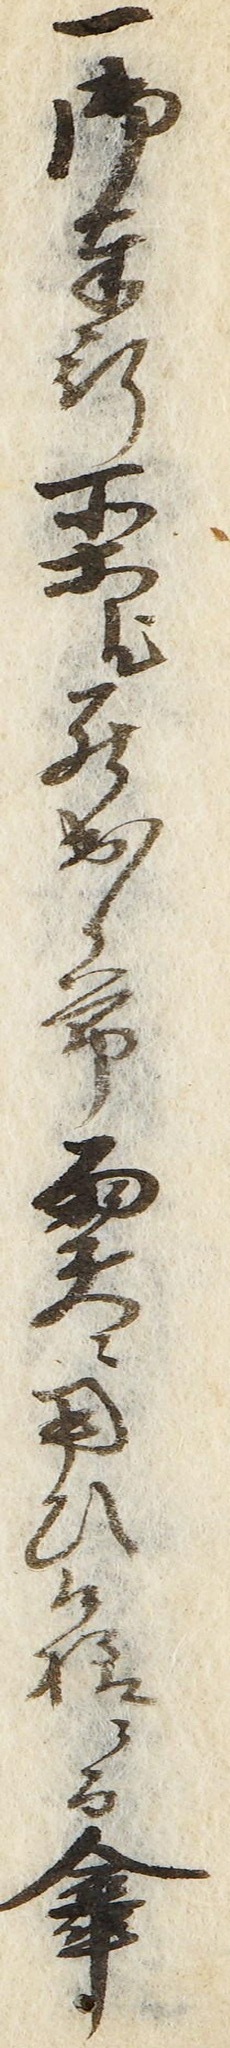一御奉行所等江罷出候節雨天ニ用ひ候様ニ而傘
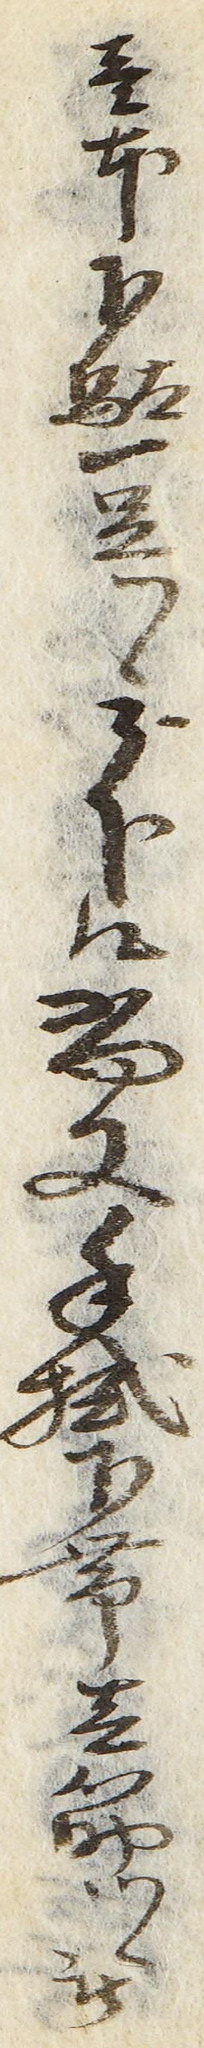壱本下駄一足ツヽ被下候尚又手拭下帯壱筋ツヽ被
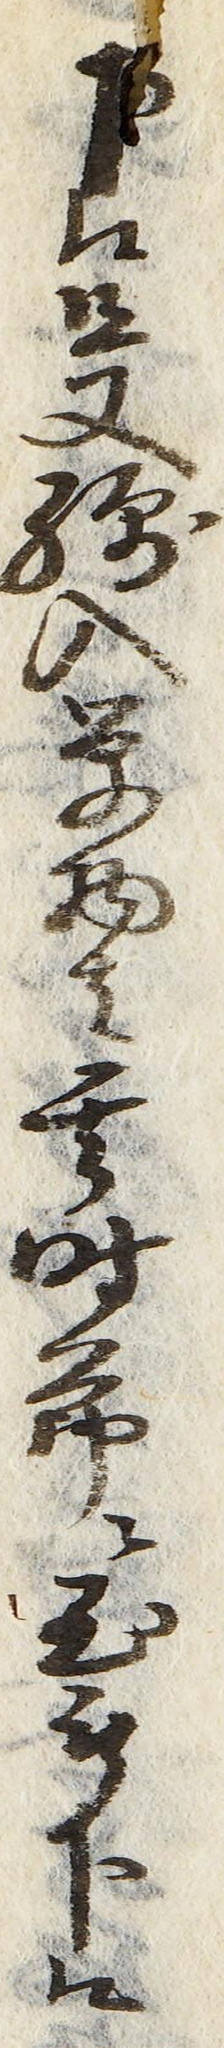下候且又綿入単物者其時節ニ至被下候
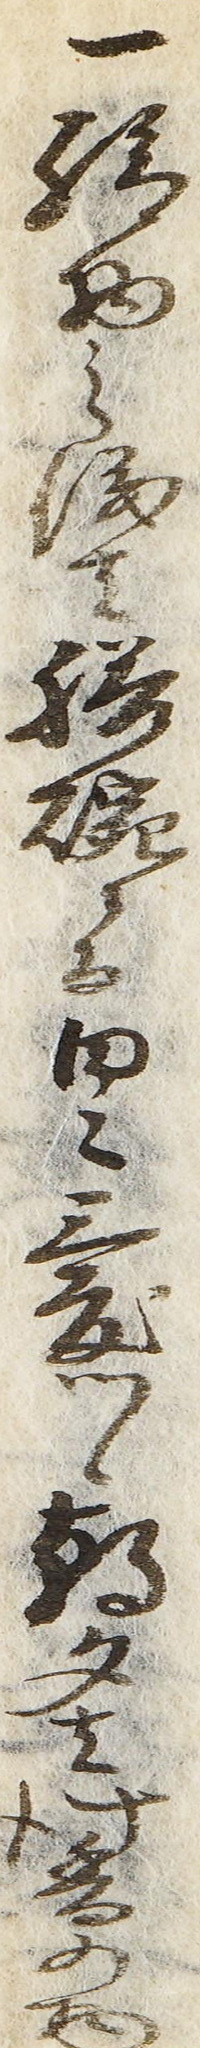一給物之儀者膳碗ニ而日々三度ツヽ朝夕者汁香の物
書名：漂流人善助聞書
